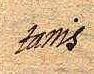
tanis
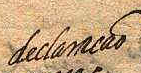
declaraçaõ
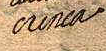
crença
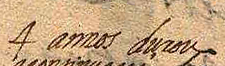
4 annos durou
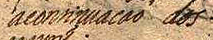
a continuaçaõ dos
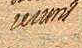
ieiuns
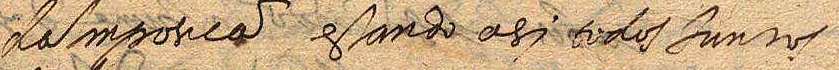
da Imposiçaõ estando asj todos juntos a
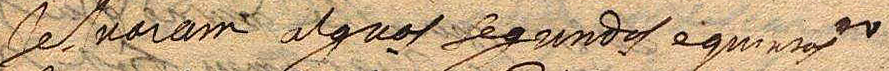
IeIuaram alguas segundas e quintas
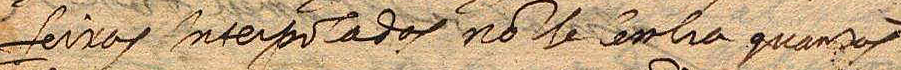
feiras Interpoladas nō se lembra quantas
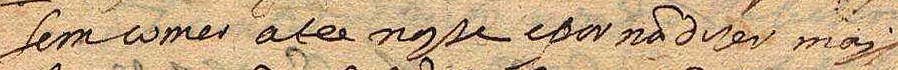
sem comer atee neste e por naõ dizer mais
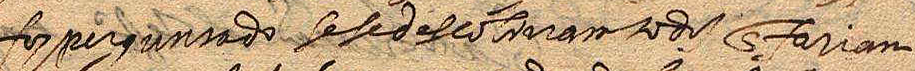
foJ perguntado se se descobriram todos q̄ faziam
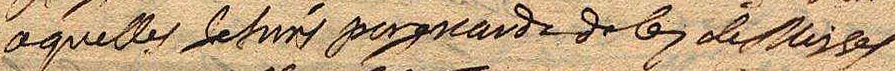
aquelles de huns per guarda da lej de Moises
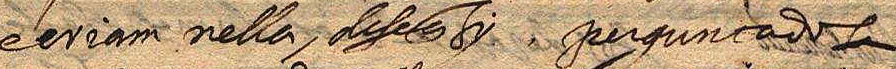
e criam nella, dise q̄ sy perguntado se
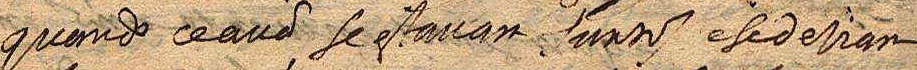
quando ceauā se estavam Iuntos e se deziam
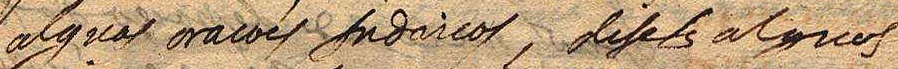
alguas oraçoẽs judaicas, dise q̄ alguas
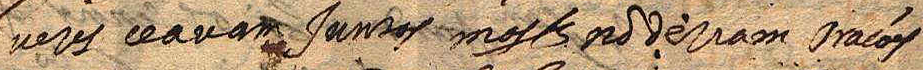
uezes ceauam Juntos mas q̄ nō deziam oraçoẽs
